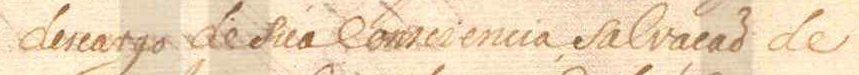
descargo de sua consciencia, salvaçaõ de
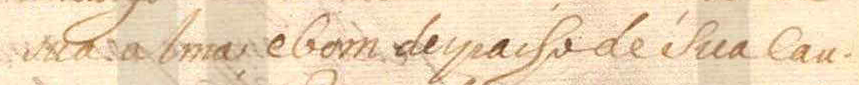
sua alma e bom despacho de sua cau
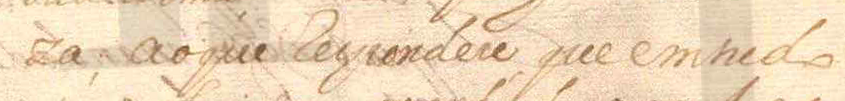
za, ao que Respondeu que em tudo
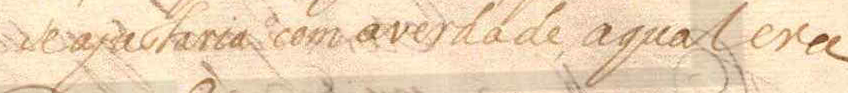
se ajustaria com a verdade, a qual era
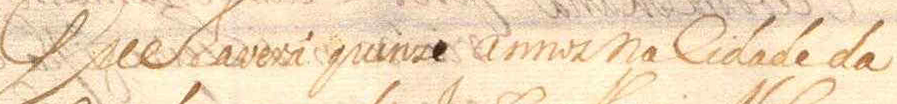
Que haverá quinze annos na Cidade da
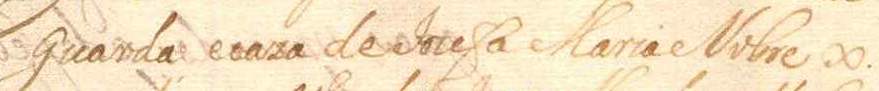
Guarda, e caza de Iozefa Maria Nobre x.
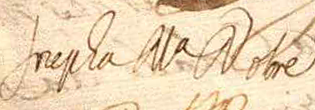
Jozepha Ma Nobre
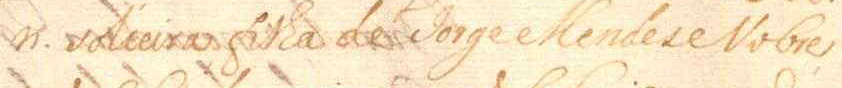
n. solteira, filha de Iorge Mendes e Nobre
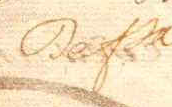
Def.ta
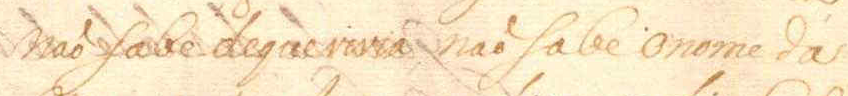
naõ sabe de que vivia, naõ sabe o nome da
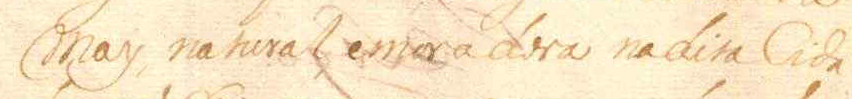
May, natural, e moradora na dita Cida
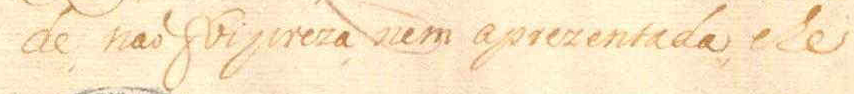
de, naõ foi preza nem aprezentada, e he
